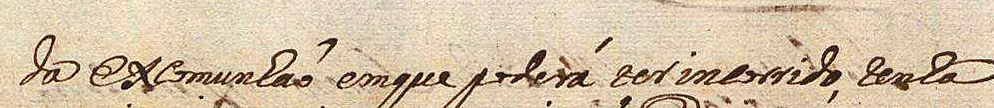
da excomunhaõ em que poderá ter incorrido, tenha
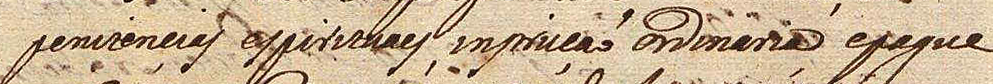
penitencias espirituaes, instruçaõ ordinaria, e pague
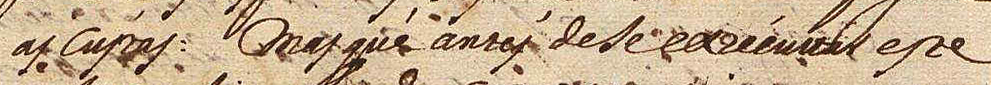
as Custas: mas que antes de se exzecuttar este
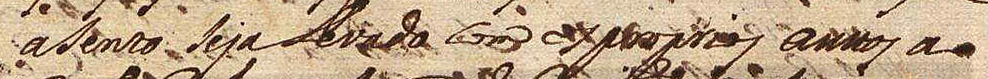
asento seja Levado com os proprios auttos ao
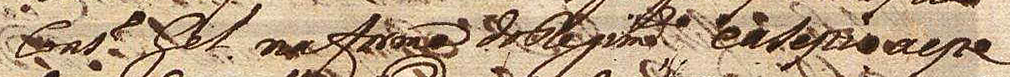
Cons.o Gel. na forma do Regim.to, e asestio a este
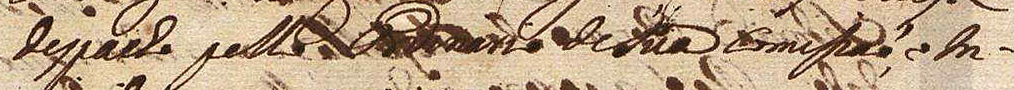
despacho pello Ordinario de sua Comissaõ, o In
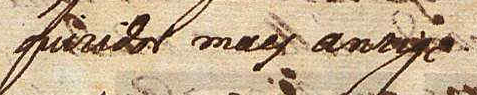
quizidor maes antigo.
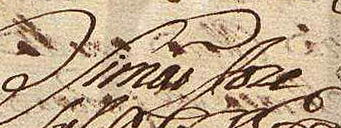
Simaõ Joze
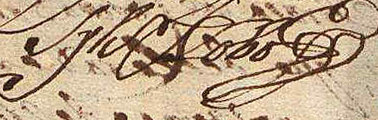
Sylvr Lobo
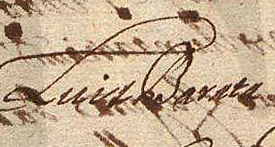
Luiz Barata
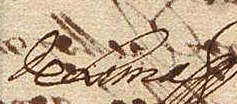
de Lima
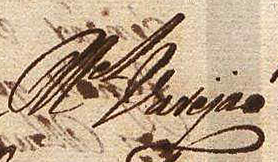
M.el Varejaõ
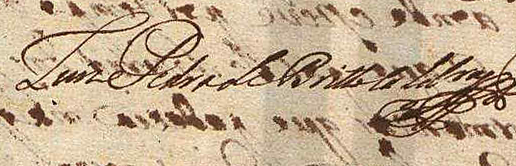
Luiz Pedro de Britto Caldra
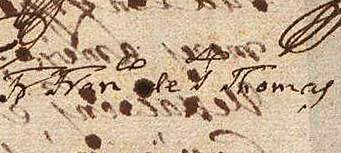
Fr Fran.co de Sto Thomas
